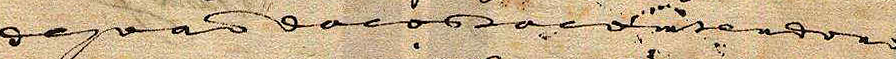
de joaõ da costa comteudo no
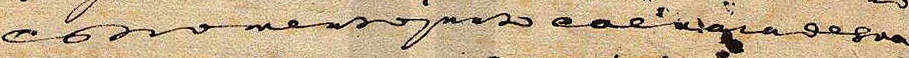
estromento junto e aluara de sua
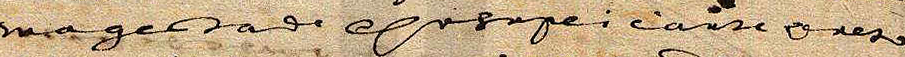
magestade e ho suplicante he neto
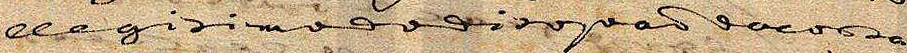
llegitimo do dito joaõ da costa
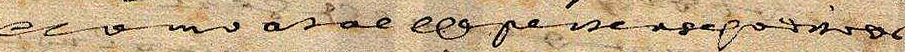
e como a tal lhe pertense ho dito hes
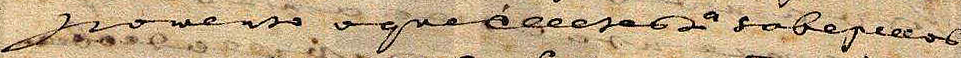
tromento o que elle testa sabe pellos
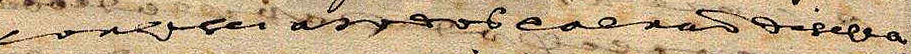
conheser a todos e al naõ dise he a
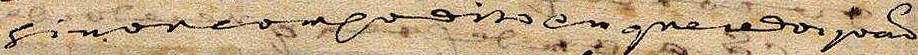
sinou com ho dito enqueredor joaõ
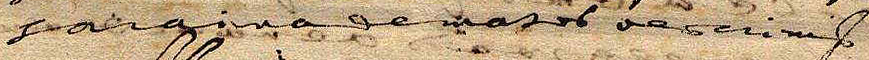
saraiua de matos o escriui
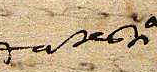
da testa
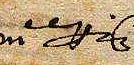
mel Riz̄
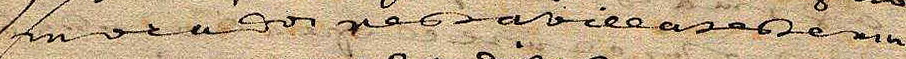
morador nesta villa testemu
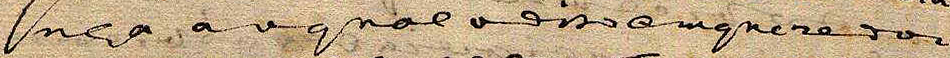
nha ao qual o dito emqueredor
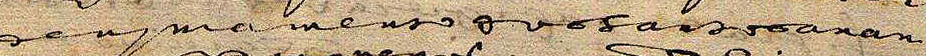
deu juramento dos santos auan
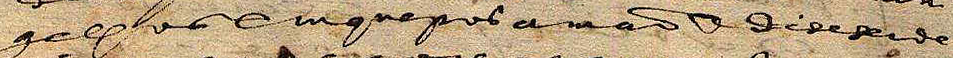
gelhos em que pos a maõ he dise ser de
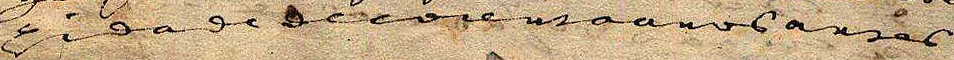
hidade de corenta anos antes
